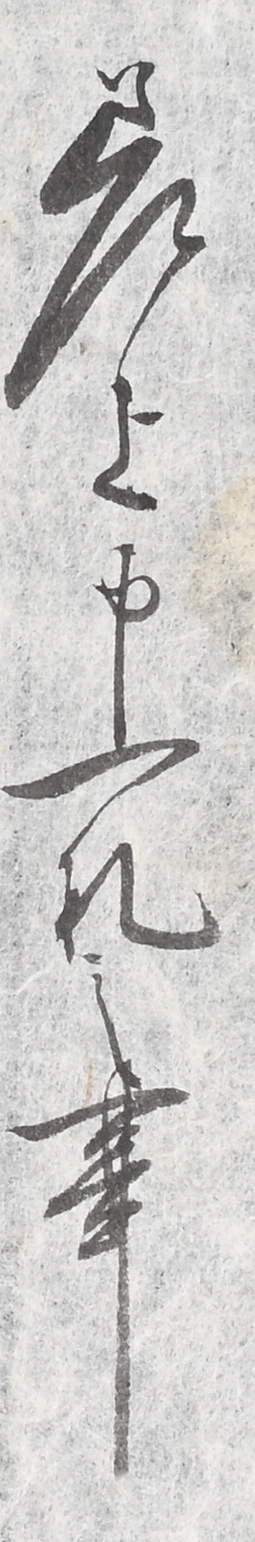差上申一札之事
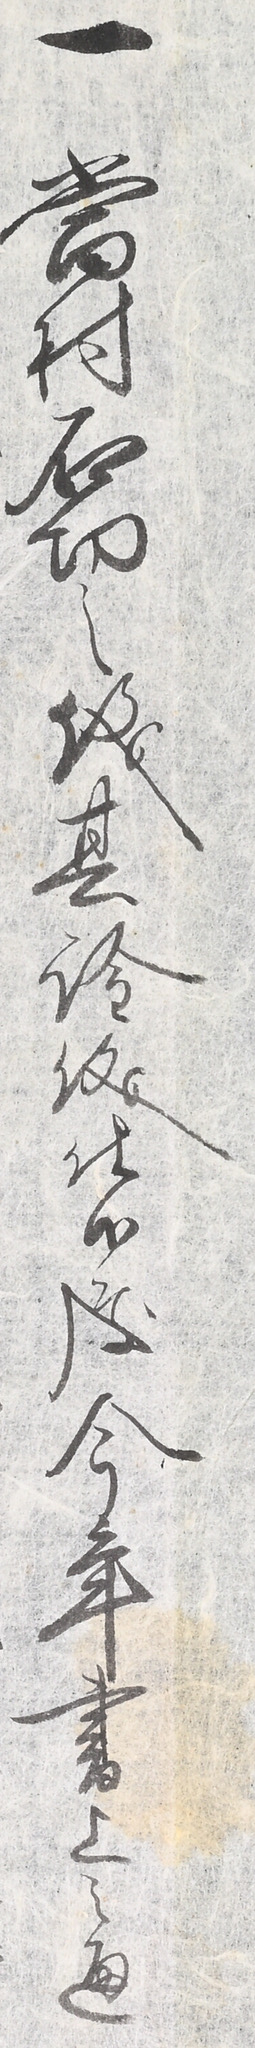一当村石切之儀其詮儀仕候処今年書上之通
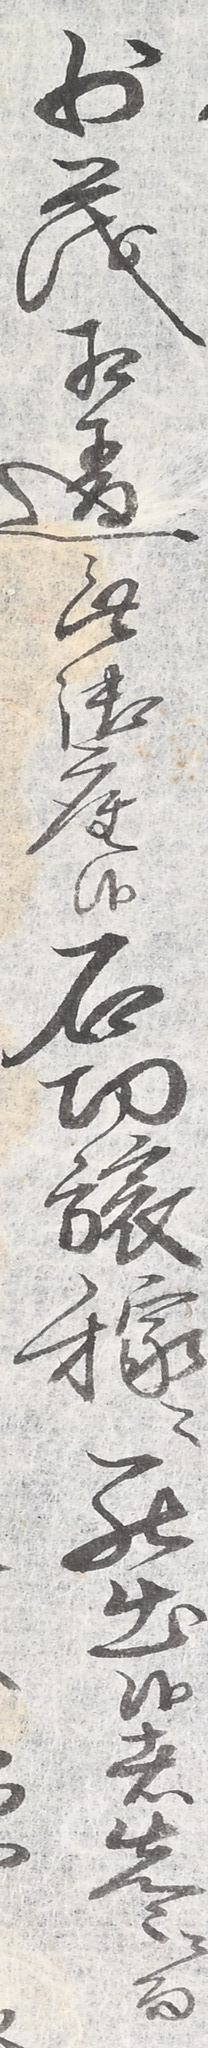少も相違無御座候石切旅稼ニ罷出候者先々ニ而
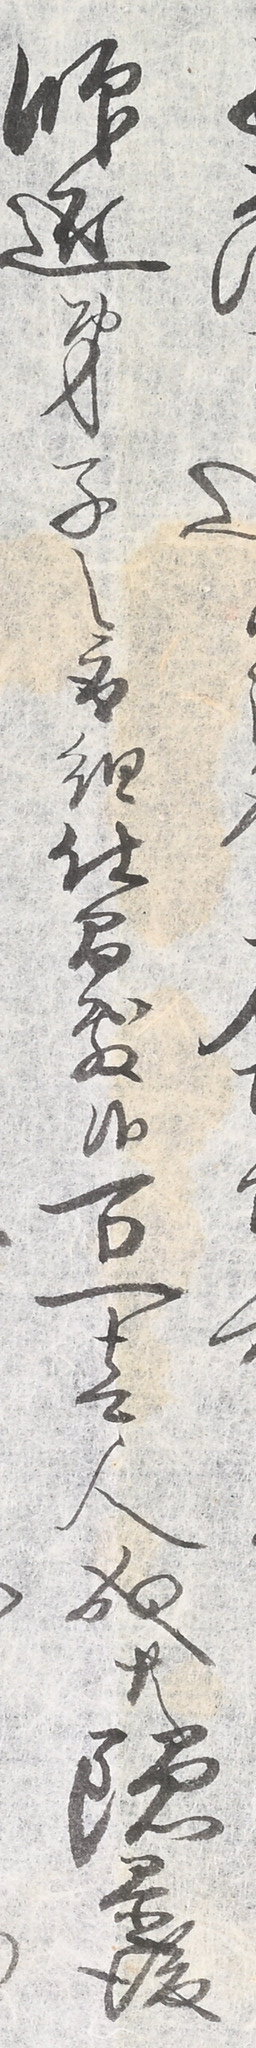師匠弟子之取組仕間敷候万一壱人成共隠置後
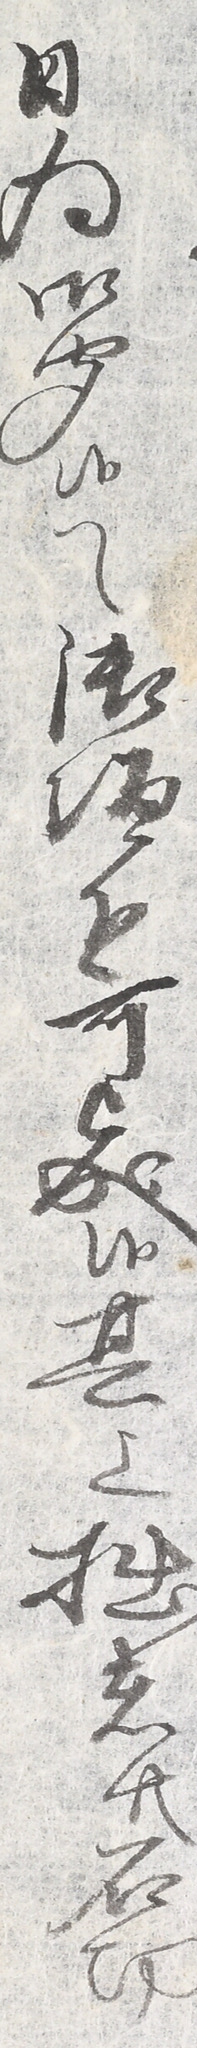日為御聞候ハヽ御注進可被成候其上拙者共石切
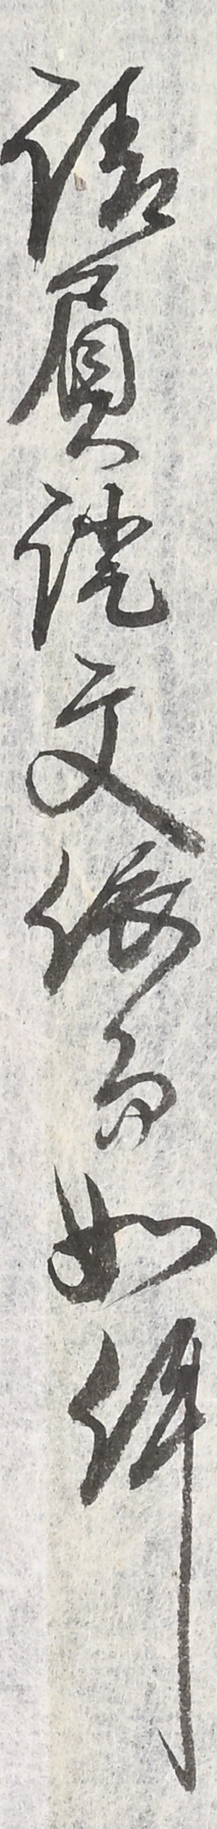請負証文依而如件
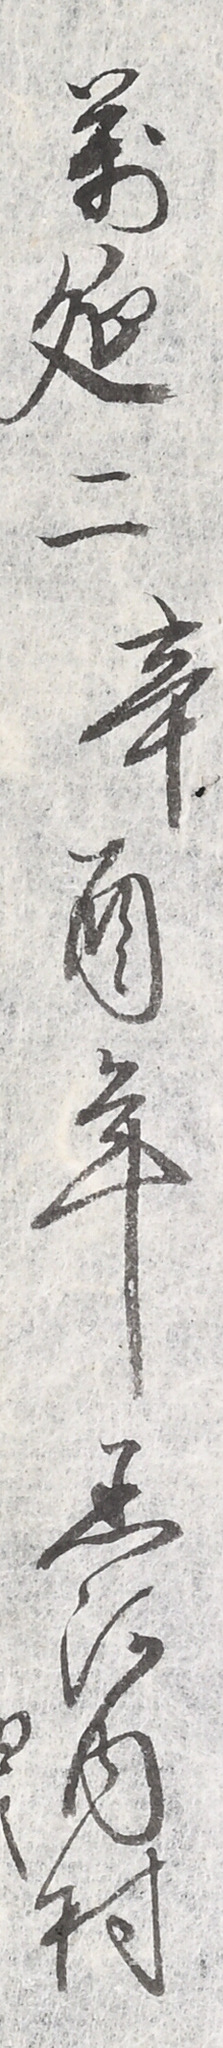万延二辛酉年黒河内村
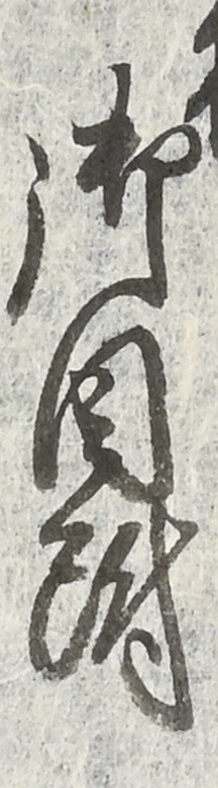御目附
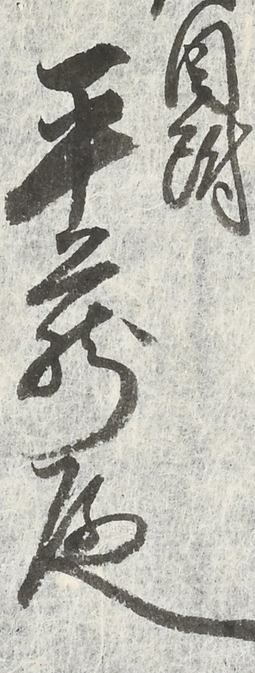平蔵殿
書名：差上申一札之事
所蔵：伊那市立高遠町図書館・合同会社AMANE
